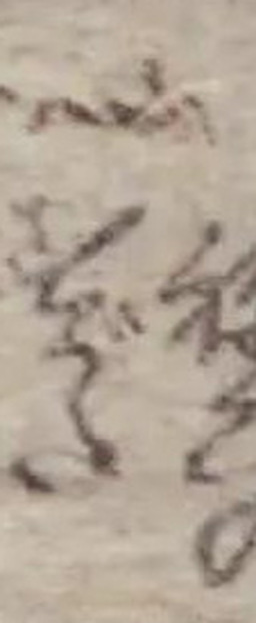すがた

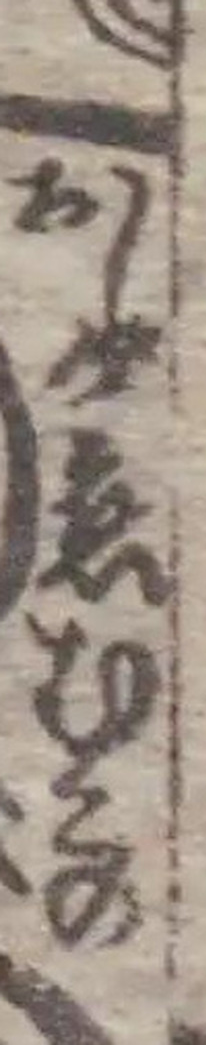おしが恋むこの
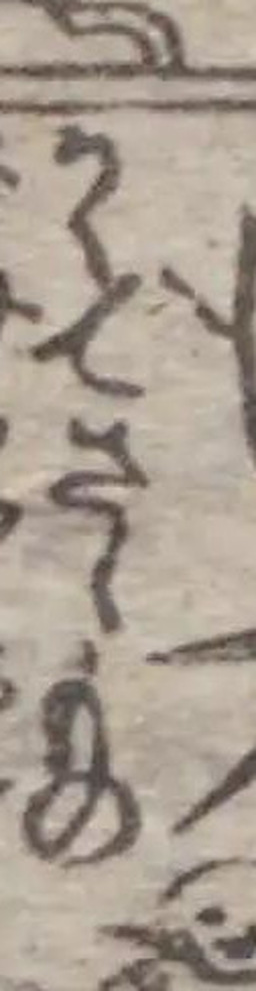かくてさしもの
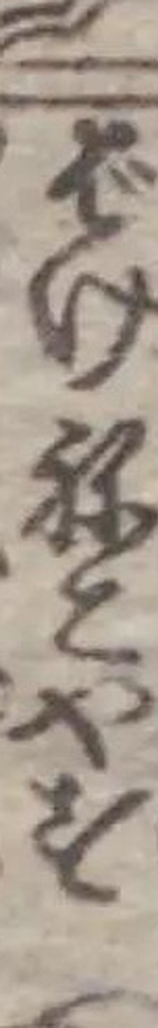ばけねこやす
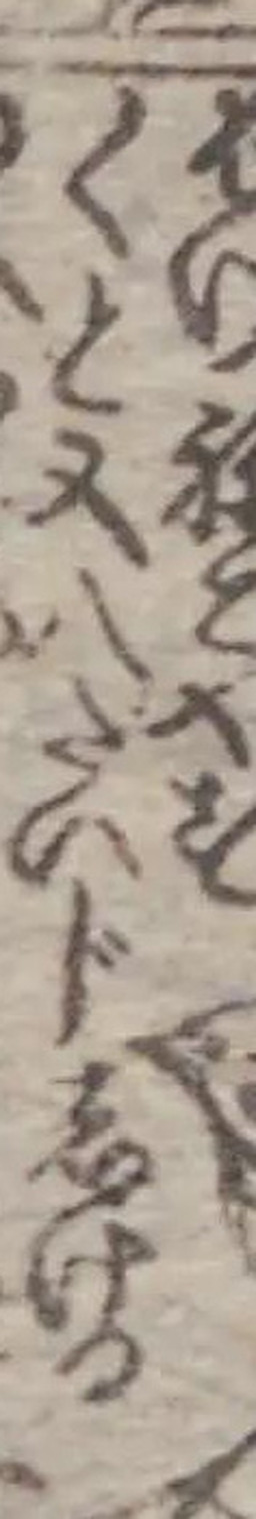〳〵と又八たいじしける
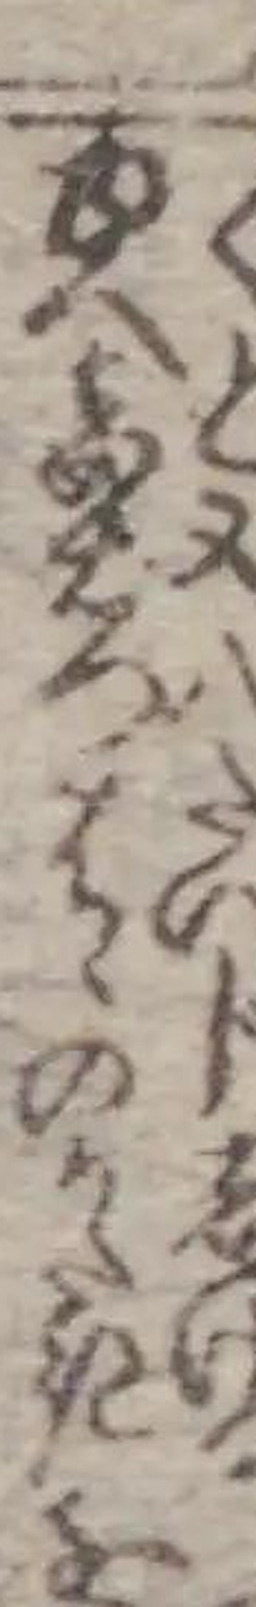ゆへ嘉右衛門はゝのかたきを
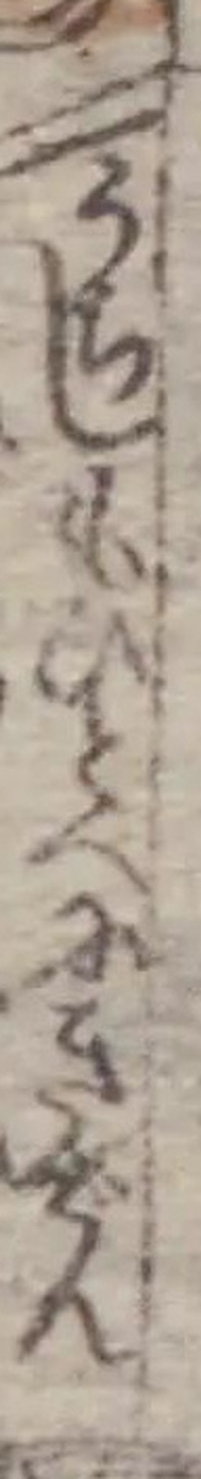うちしもひとへにきでん
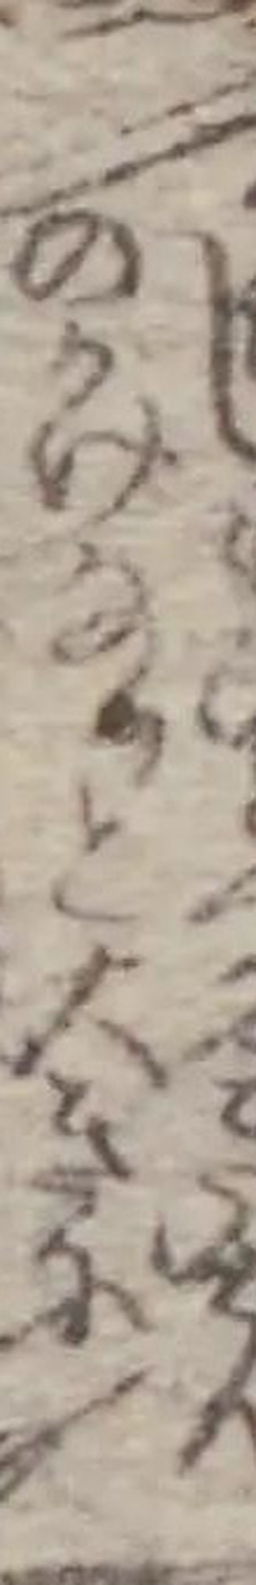のかげなりと大きに
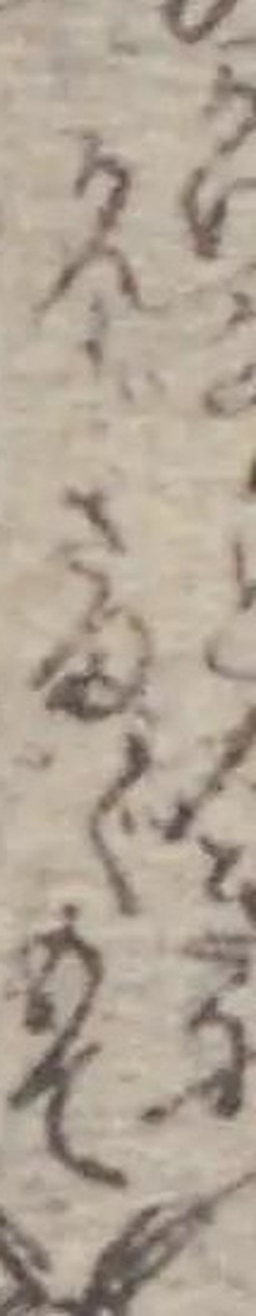かんじさま〴〵もて
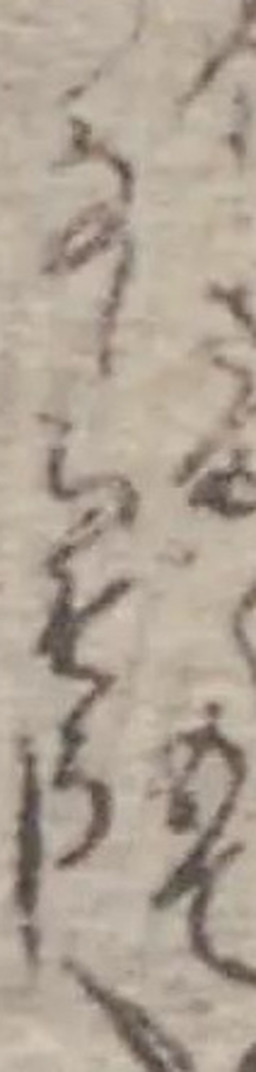なしちそうし
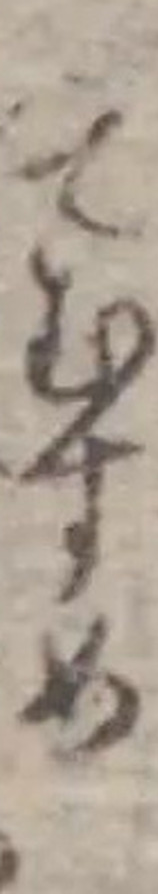てむすめ
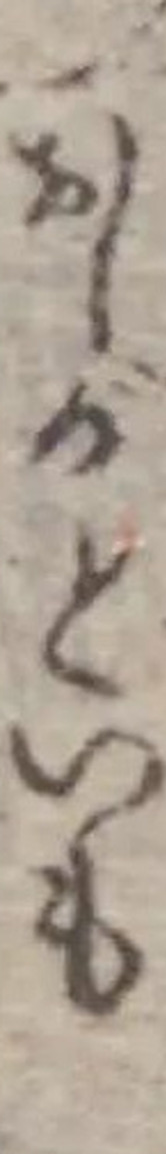おしがといも
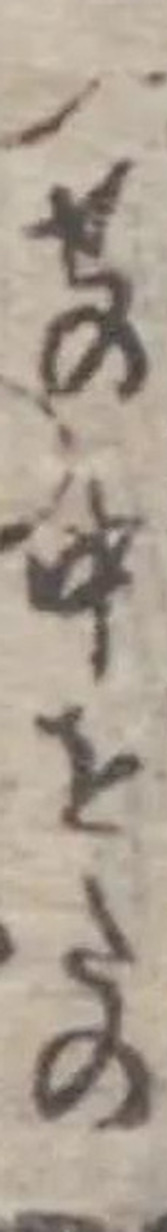せの中をたの
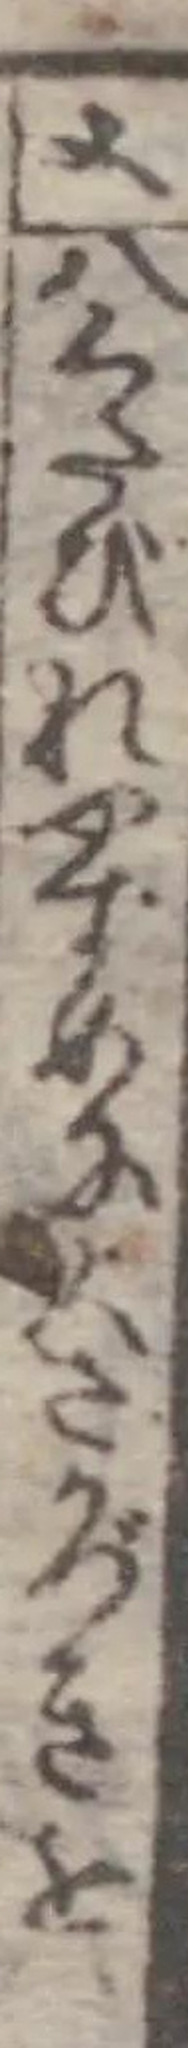又八くたびれやすめに大さかづきを
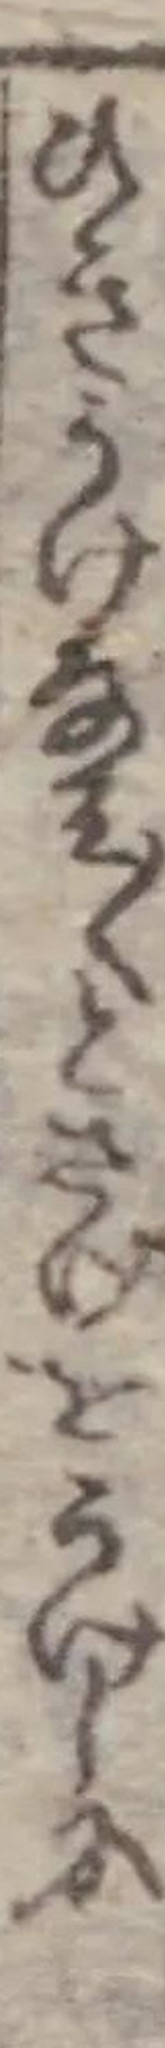ひきうけなみ〳〵とさけをうけしに
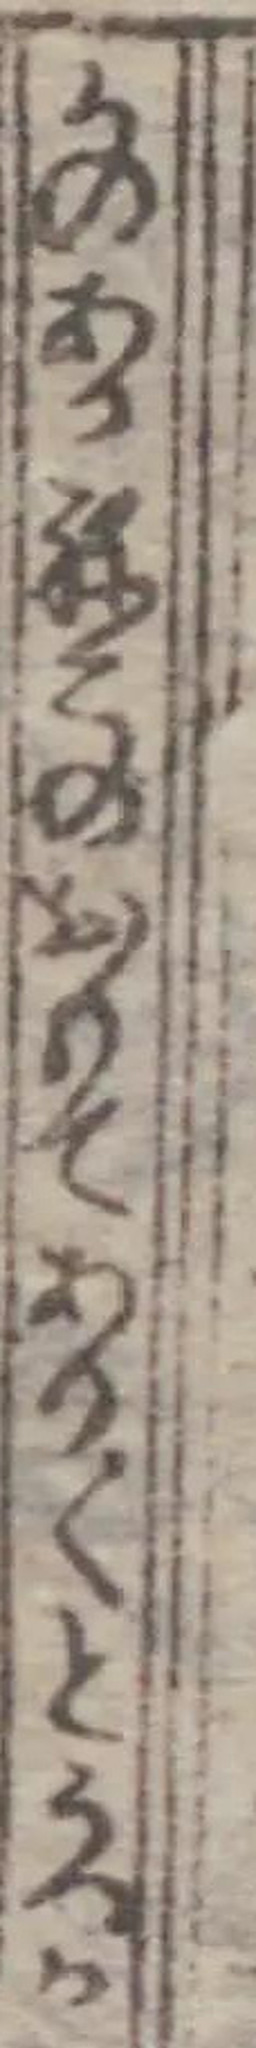かのあかねこのおもてあり〳〵とうつる
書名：鎌田又八 2巻
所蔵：国立国会図書館 National Diet Library, JAPAN
